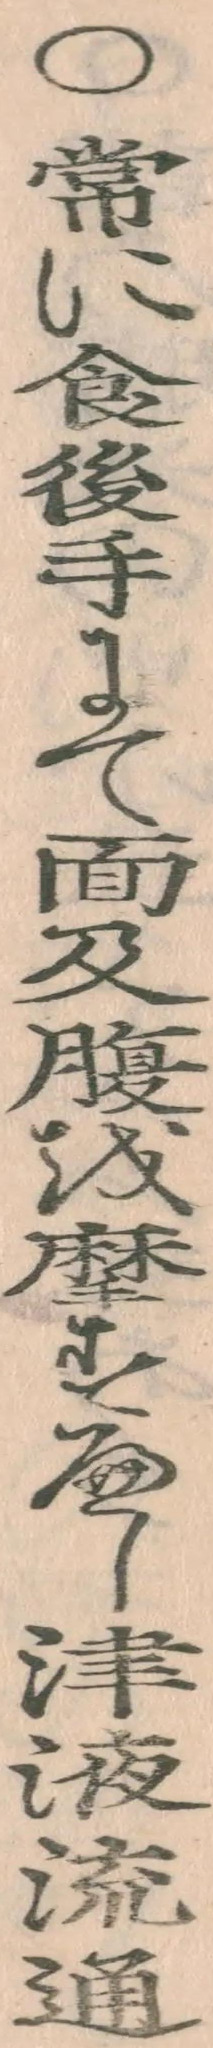〇常に食後手にて面及腹を摩すへし津液流通
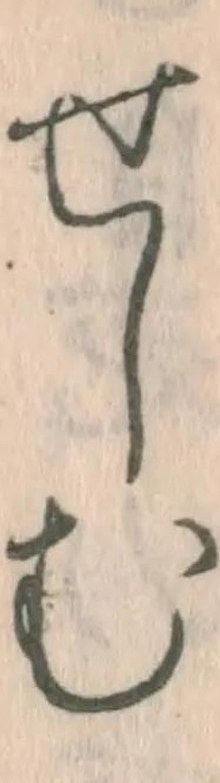せしむ
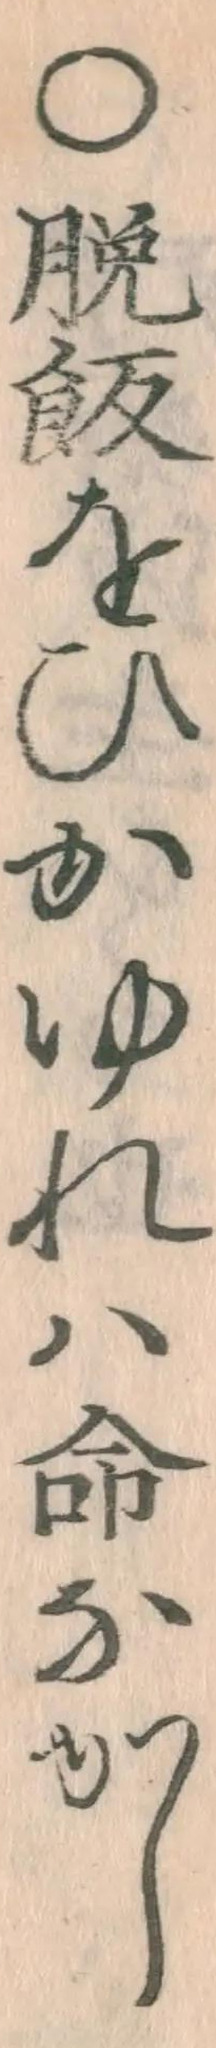〇脕飯をひかゆれは命なかし
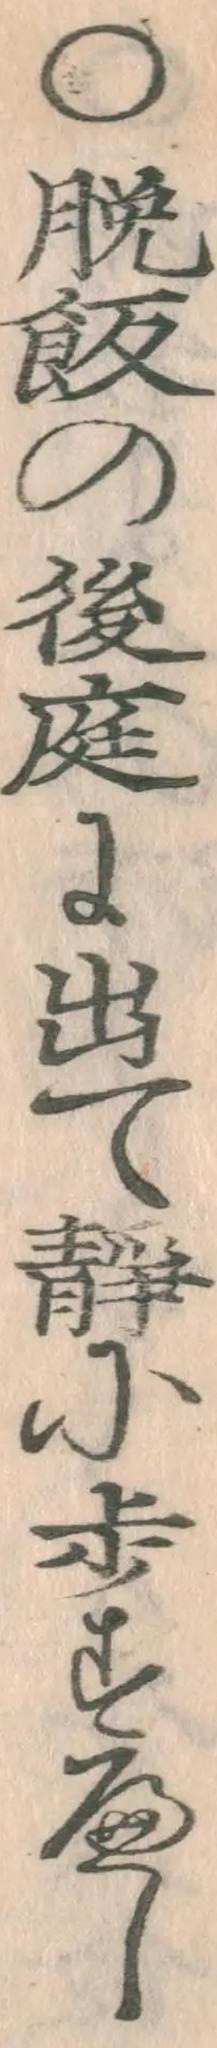〇脕飯の後庭に出て静に歩すへし
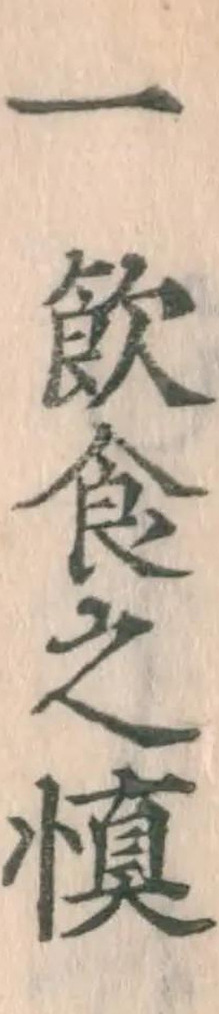一飲食の慎
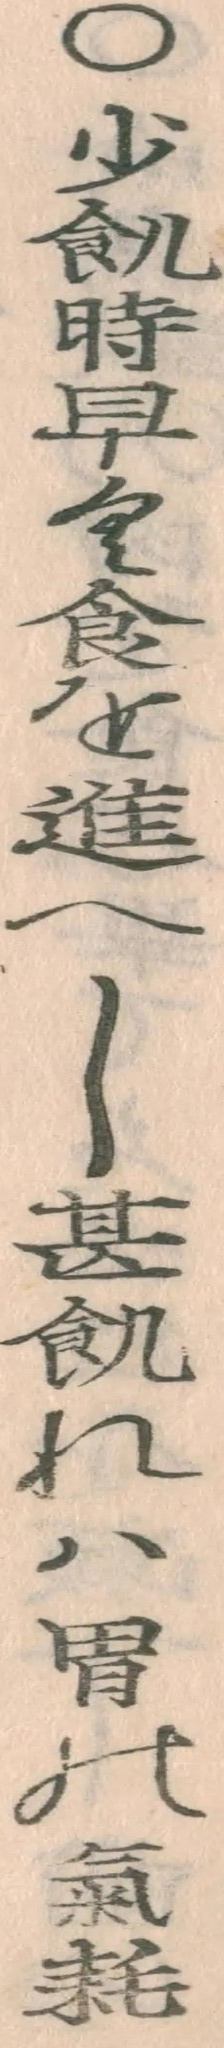〇少飢時早く食を進へし甚飢れは胃の気耗
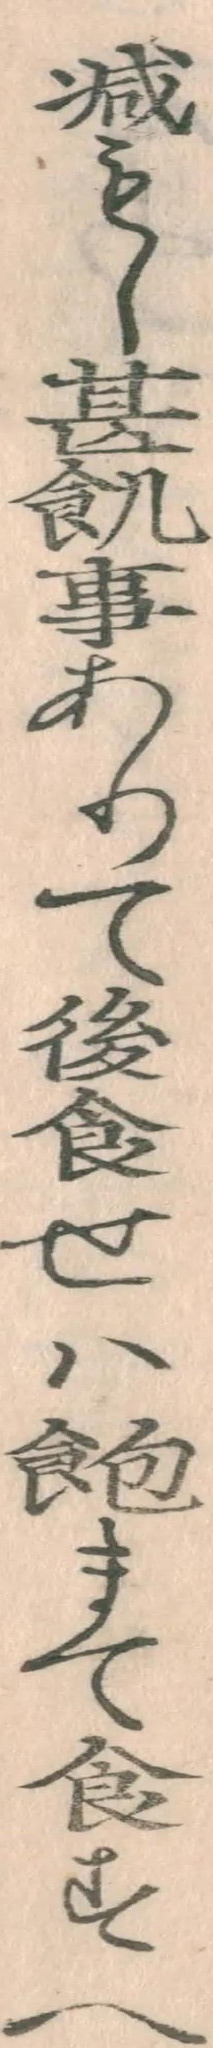減もし甚飢事ありて後食せは飽まて食すへ
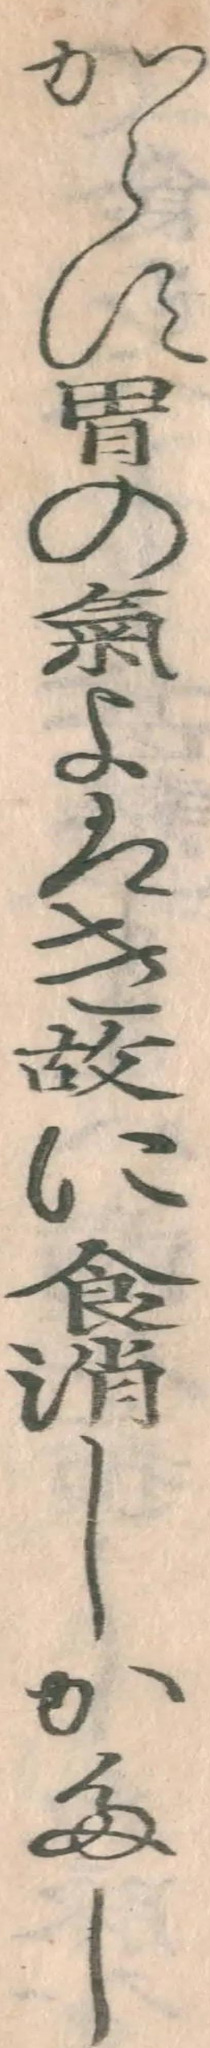からす胃の気よはき故に食消しかたし
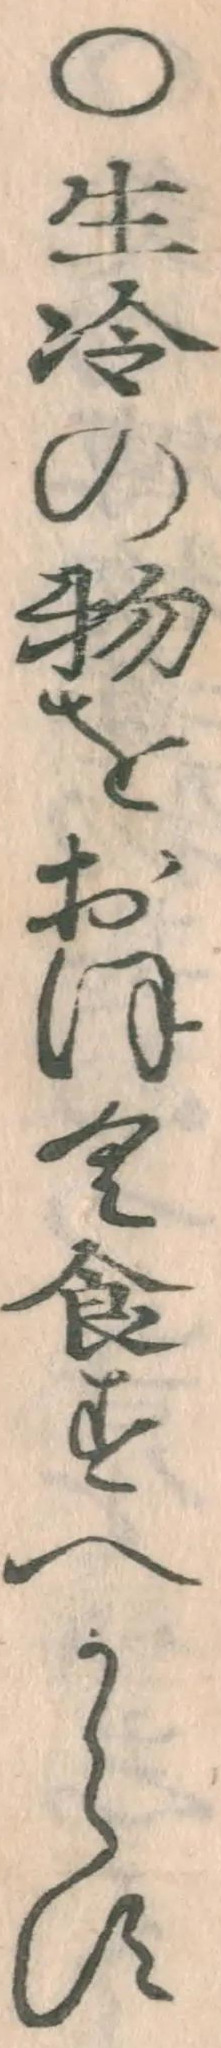〇生冷の者をおほく食すへからす

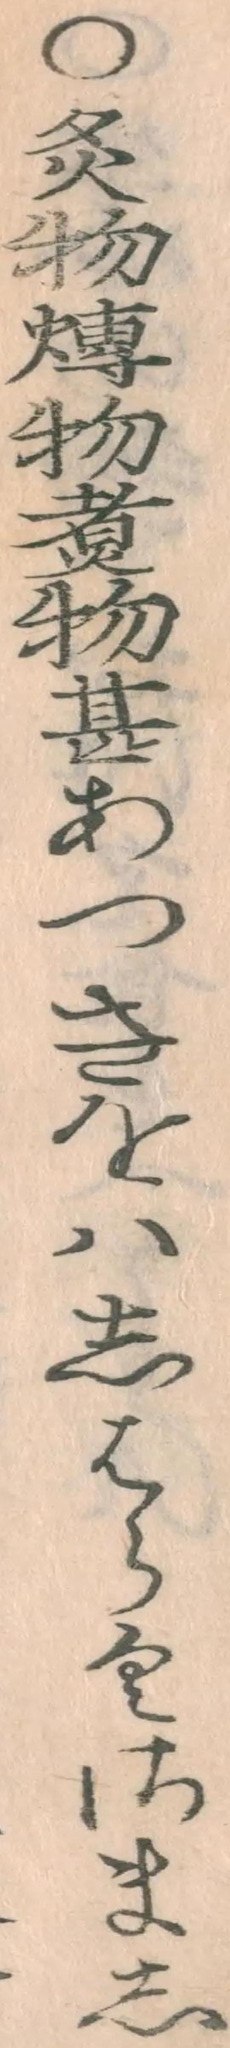〇炙物物煮物甚あつきをはしはらくさまし
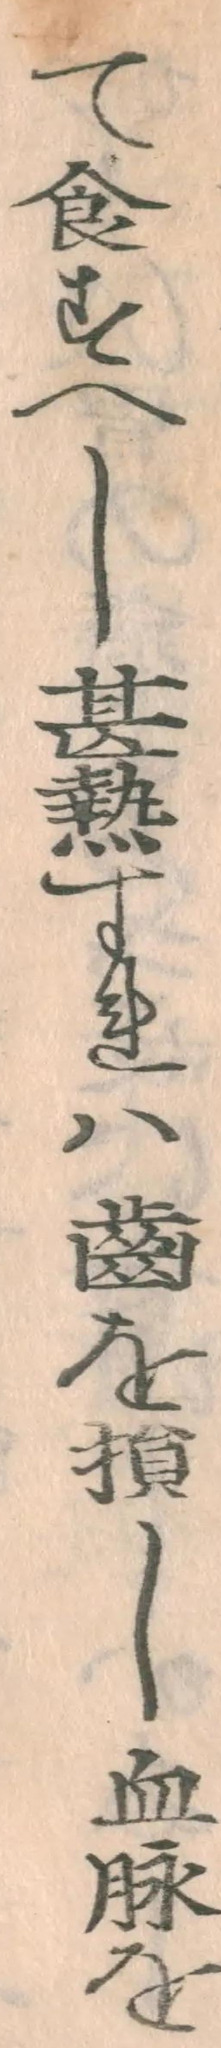て食すへし甚熱すれは歯を損し血脈を
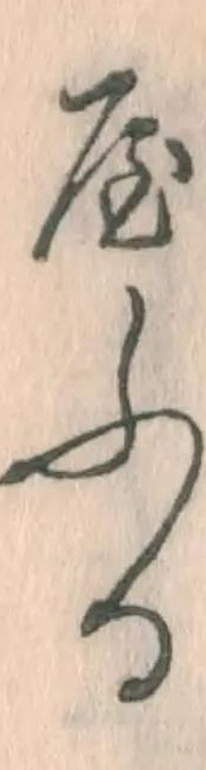やふる
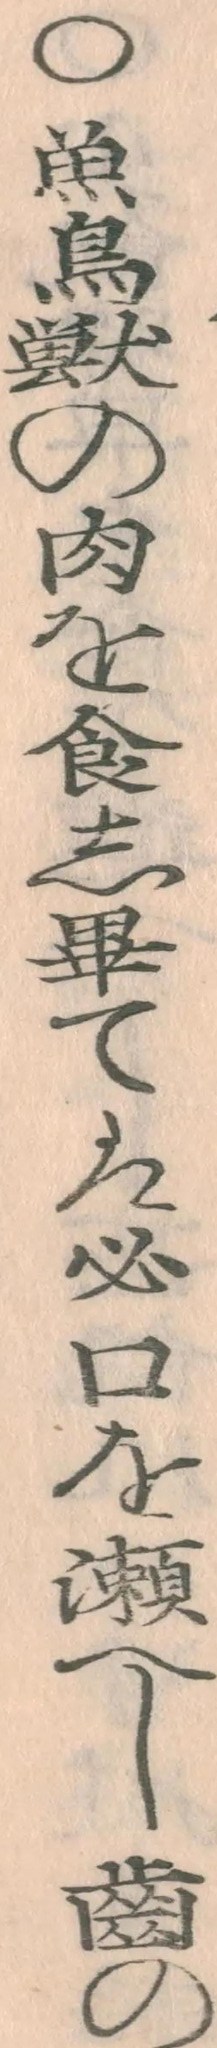〇魚鳥獣の肉を食し畢ては必口を瀬へし歯の
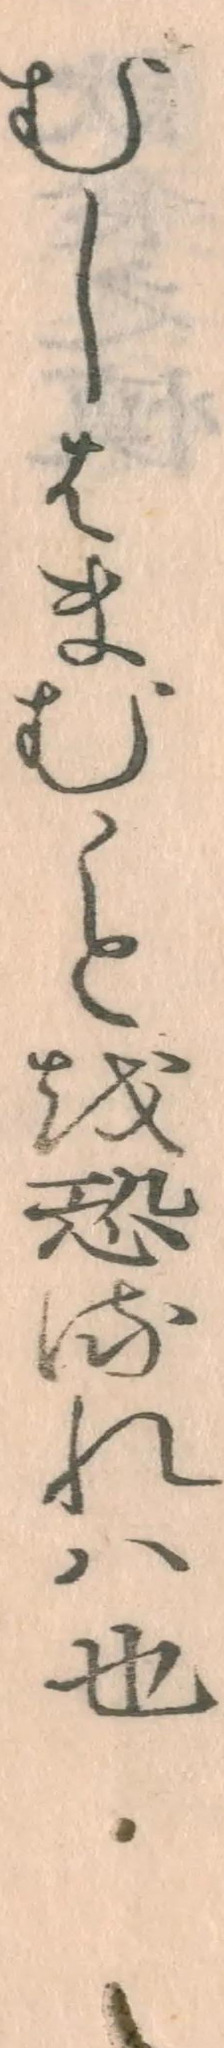むしはまむことを恐るれは也
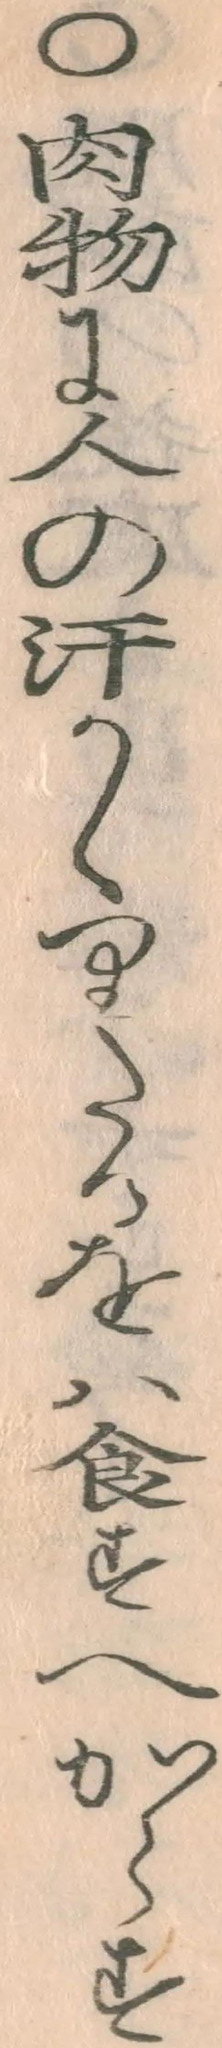〇肉物に人の汗かゝりたるをは食すへからす
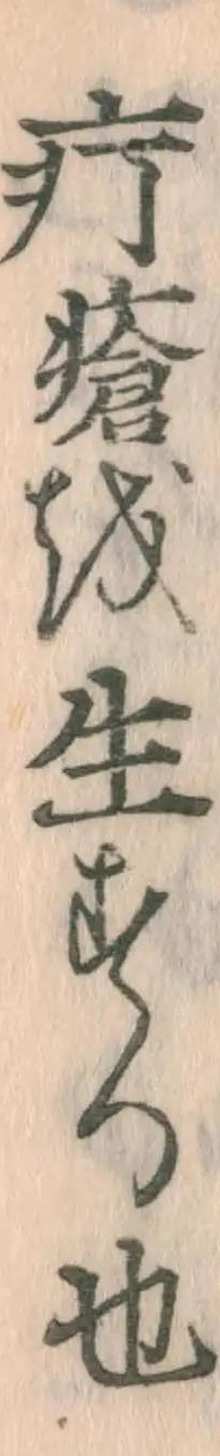疔瘡を生する也
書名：延壽撮要
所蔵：国立国会図書館 National Diet Library, JAPAN
